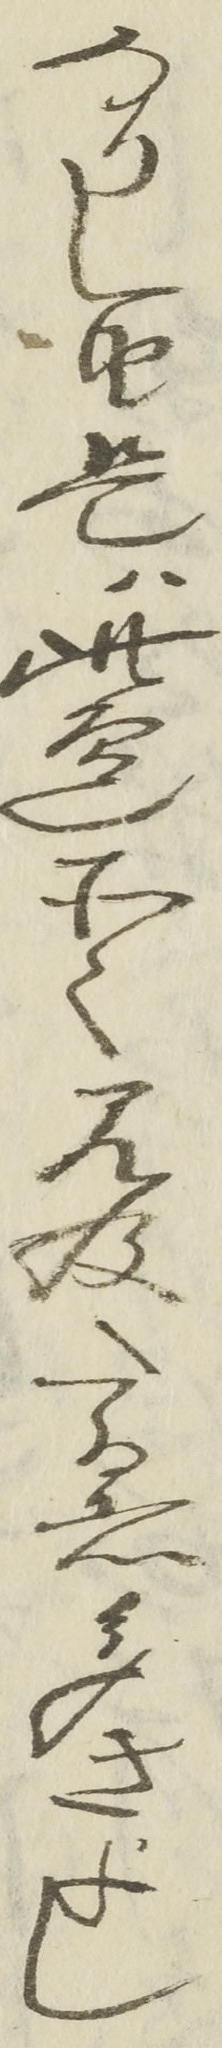なりし由是は此辺所〻見及たる者多きよし
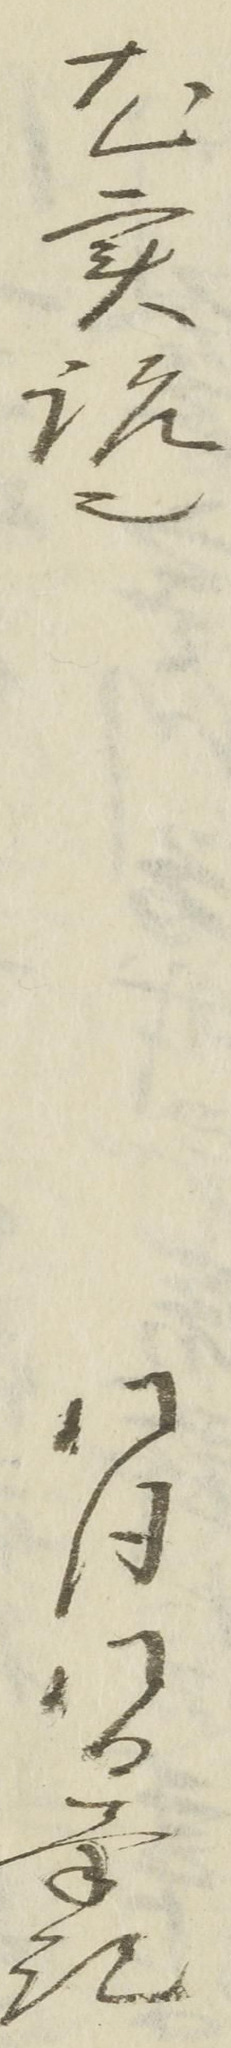尤実説也同月同日筆記
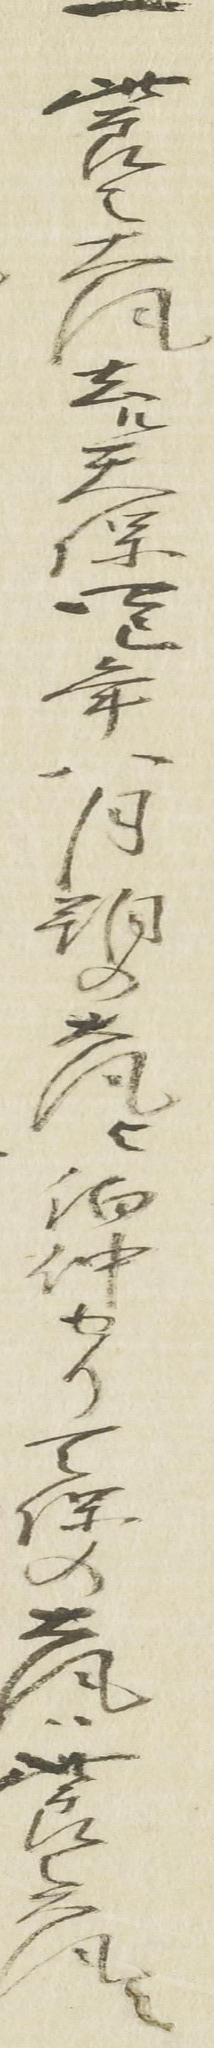一此節之大風去る天保四巳年八月朔の大風と伯仲せり天保の大風は此節之大風
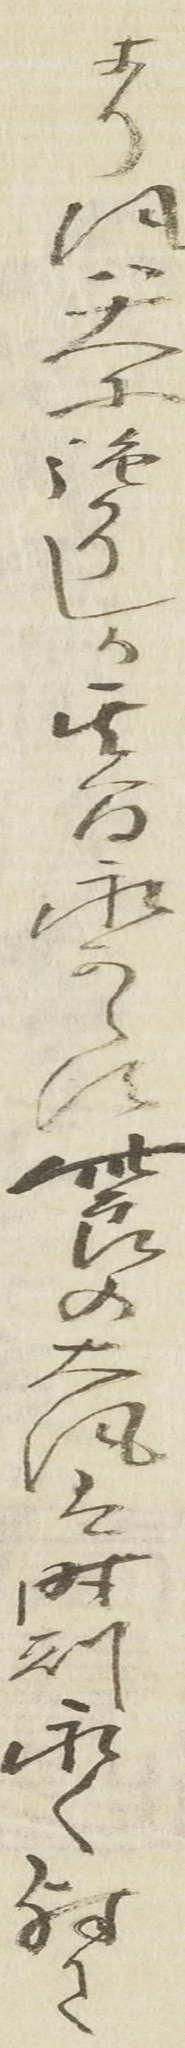より風は大に強かりしか其間永からす此節の大風は時刻永く殊に
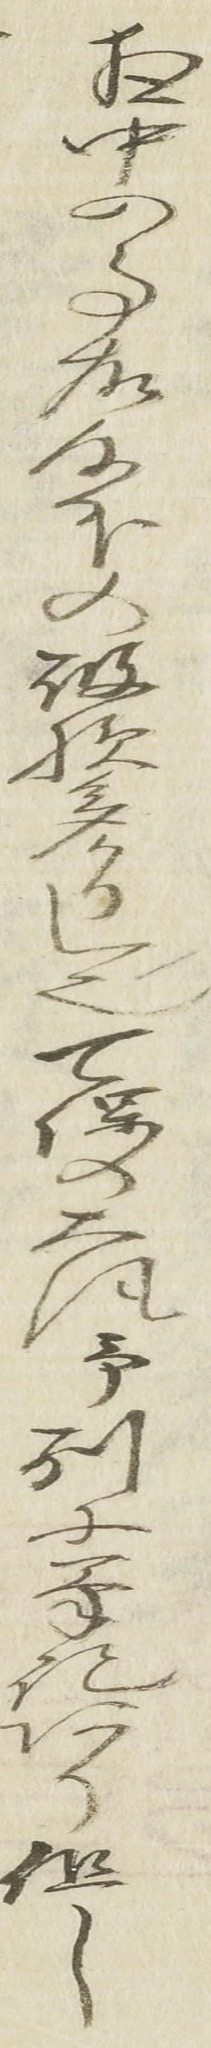夜中の事故存外の破損多かりし也天保の大風予別に筆記あり但し
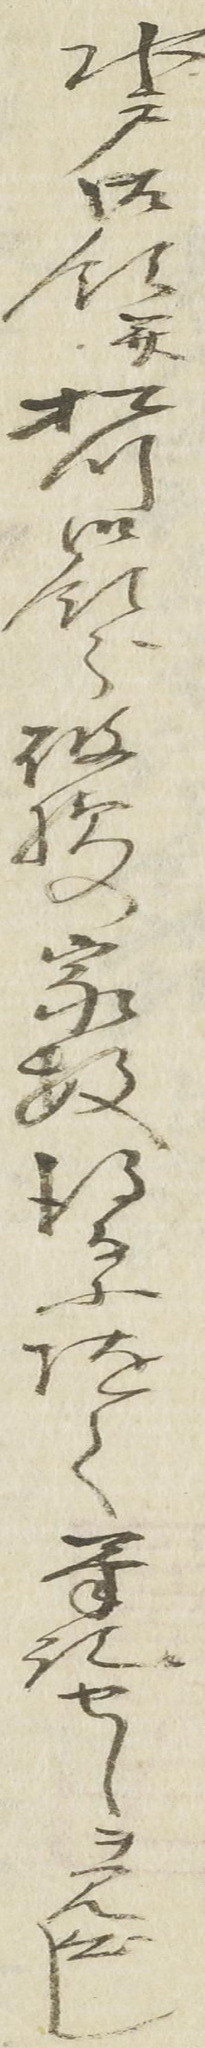水戸御領并松川御領分破損の家数得るに随て筆記せしを見出し
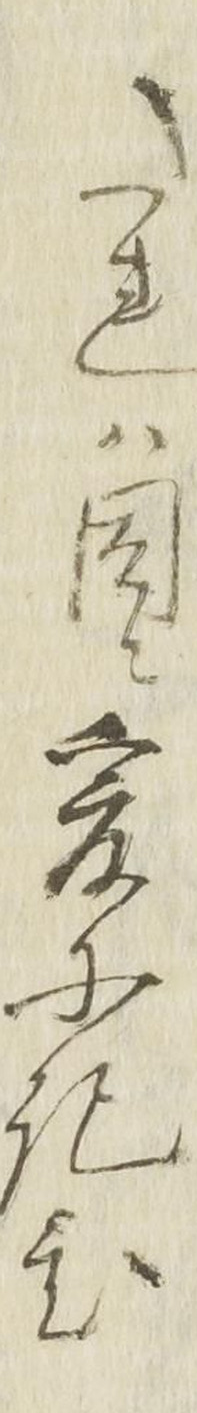たれは因て爰に記置
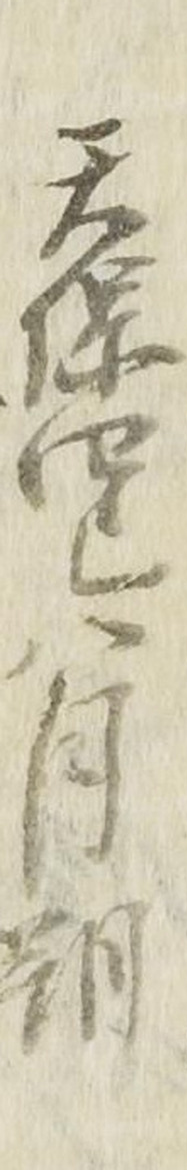天保四巳八月朔
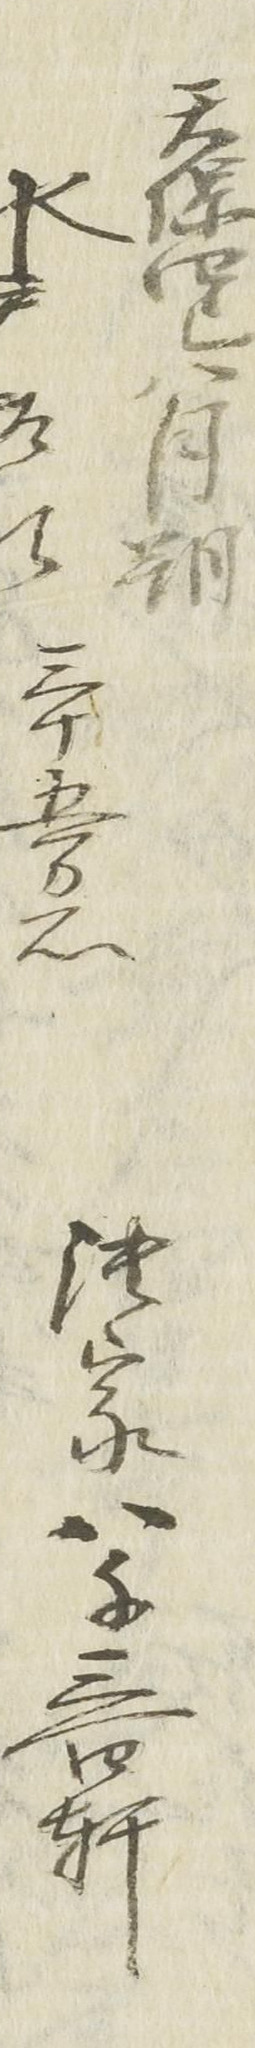水戸御領三十五万石潰家八千三百軒
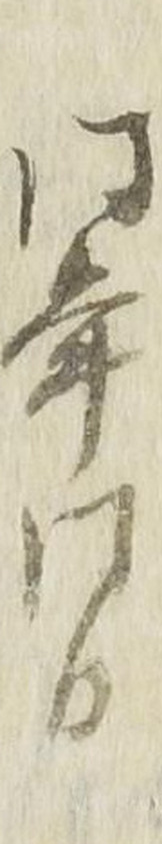同年同日
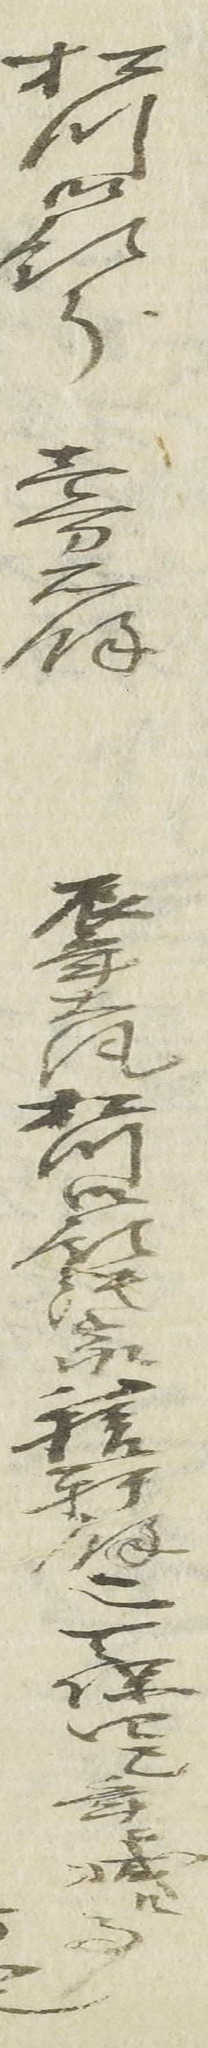松川御領分壱万石餘辰年大風松川御領潰家八拾軒餘也天保四巳年減る事可知也
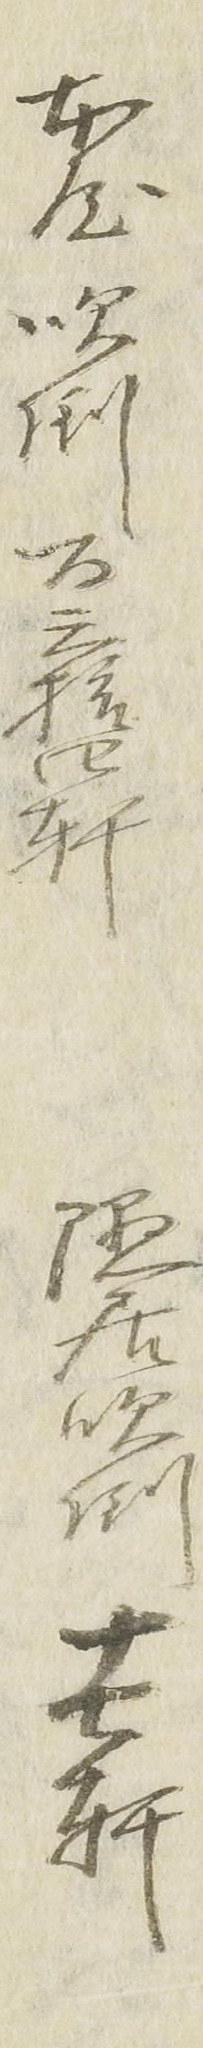本屋吹倒百六拾四軒隠居吹倒十七軒
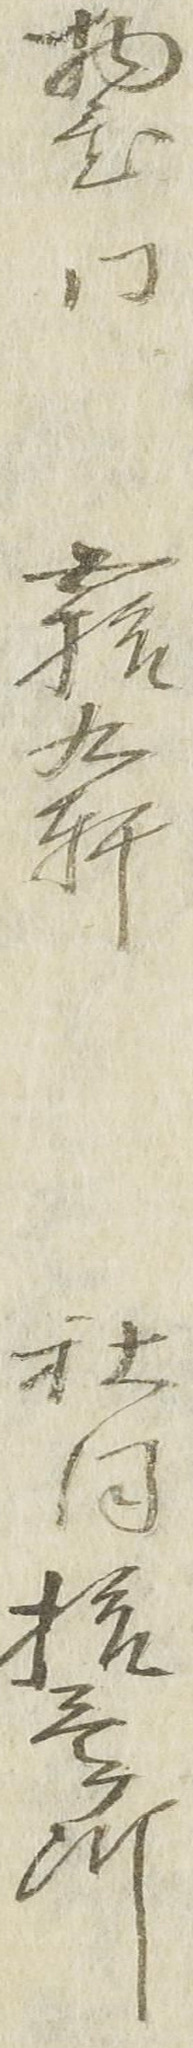物置同五拾九軒社同拾壱ケ所
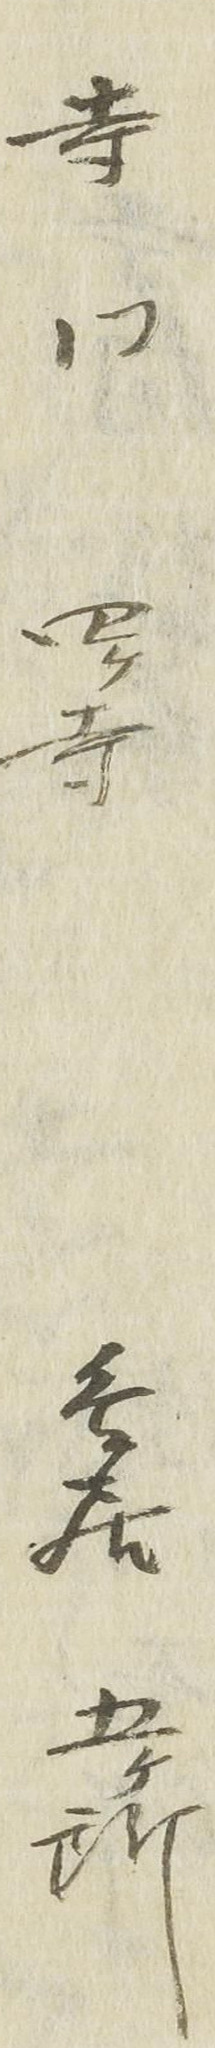寺同四ケ寺鳥居五ケ所

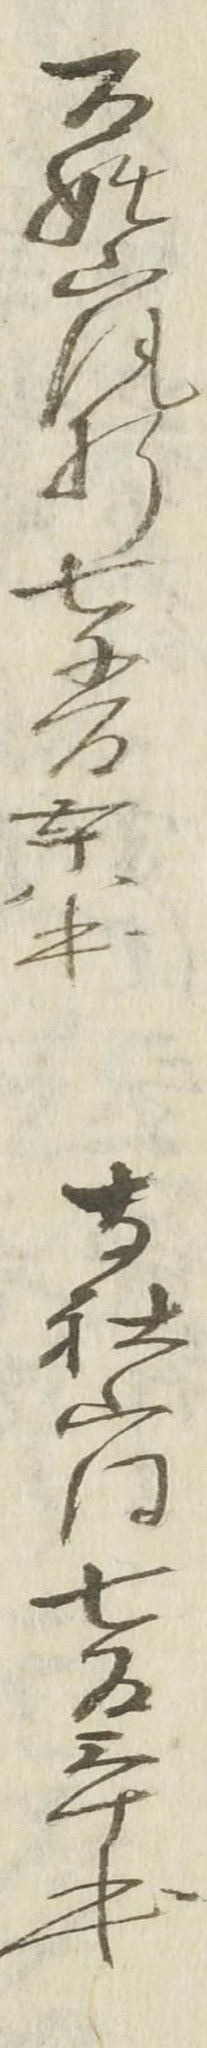百姓山風折七千百五十八本寺社山同七百三十本
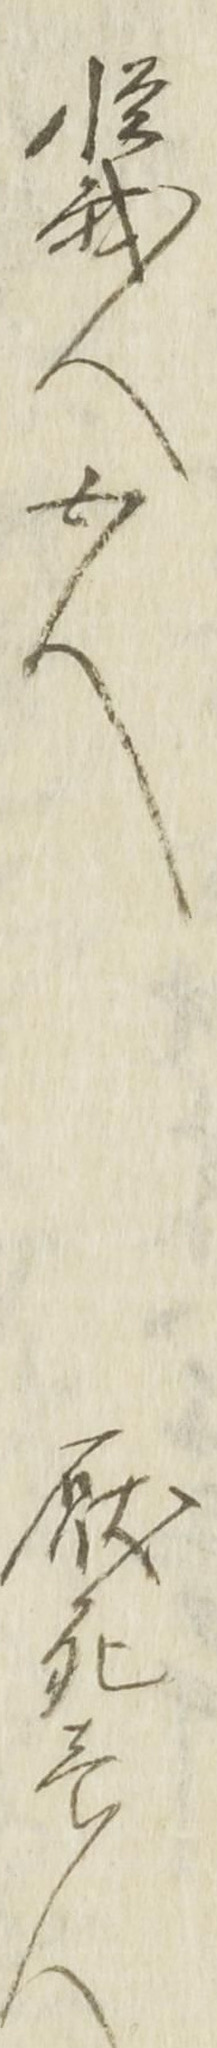怪我人五人圧死壱人
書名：安政乙卯江戸大地震筆記　安政丙辰八月大阪大雷雨之記追加　安政三辰年七月松前辺大地震并八月大風雨記録
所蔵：東京大学地震研究所図書室 Earthquake Research Institute Library, The University of Tokyo, JAPAN
